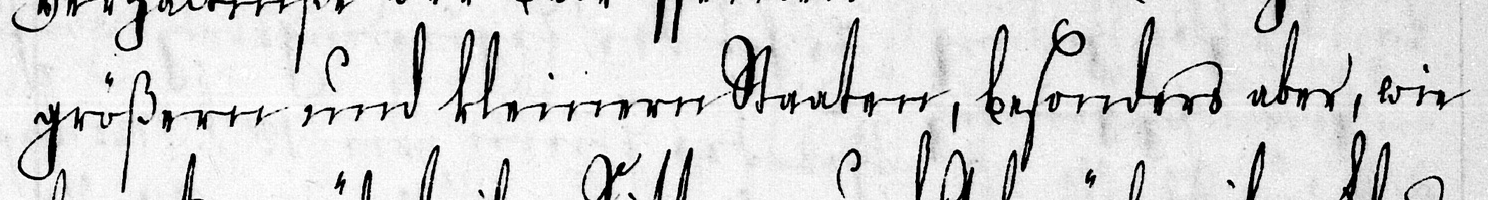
größern und kleinern Staaten, besonders aber, wie
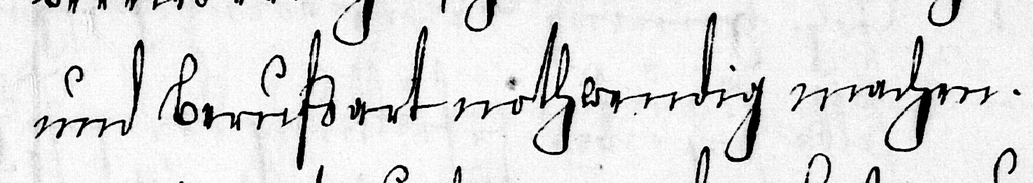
und Berufsart nothwendig machen.
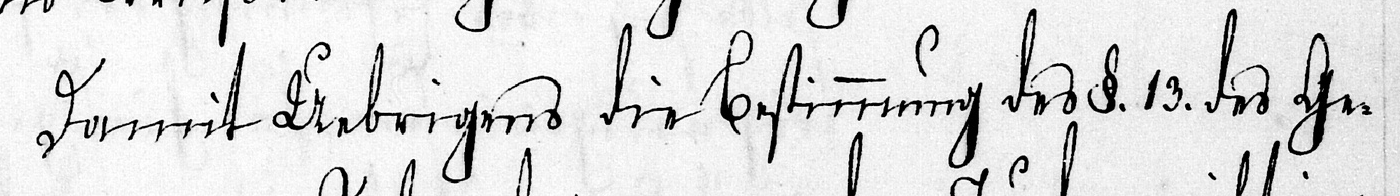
Damit Uebrigens die Bestimmung des §. 13. des Ge¬
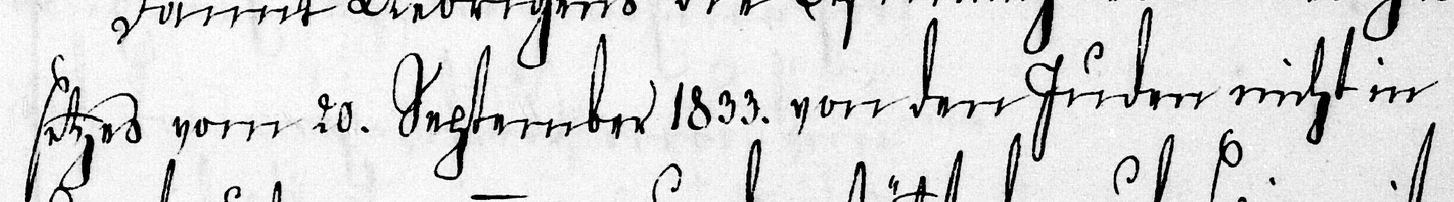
setzes vom 20. September 1833. von den Juden nicht in
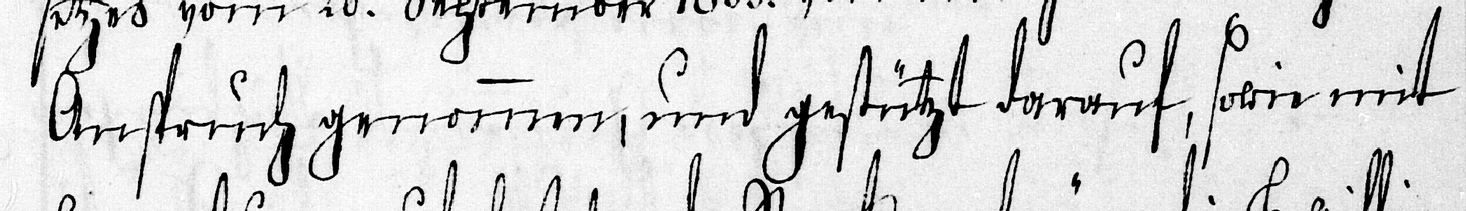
Anspruch genommen, und gestützt darauf, sowie mit
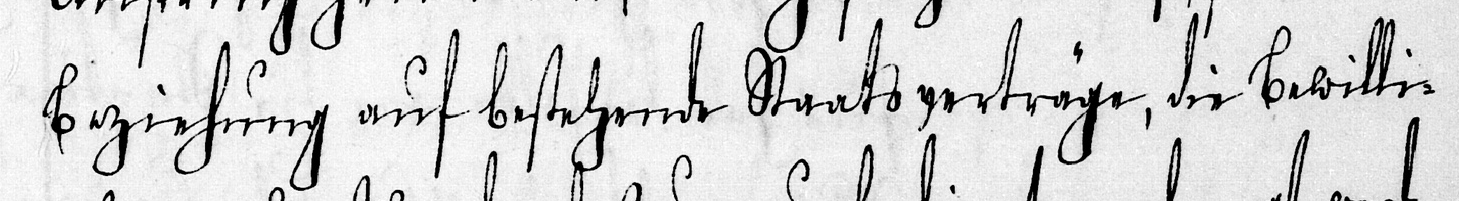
Beziehung auf bestehende Staatsverträge, die Bewilli¬
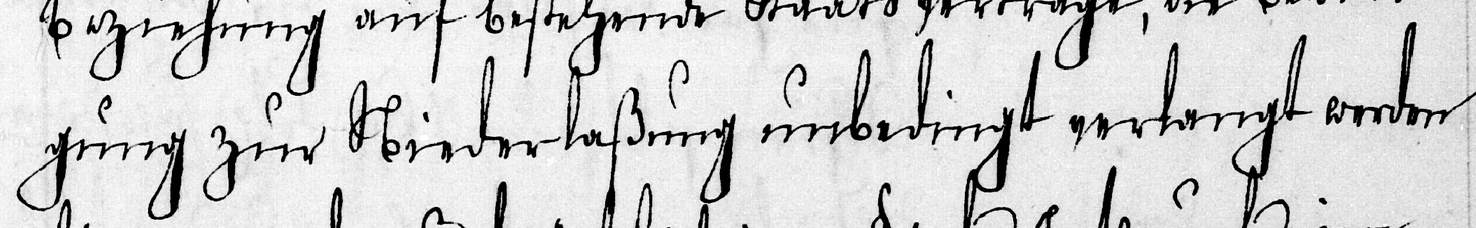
gung zur Niederlaßung unbedingt verlangt werden
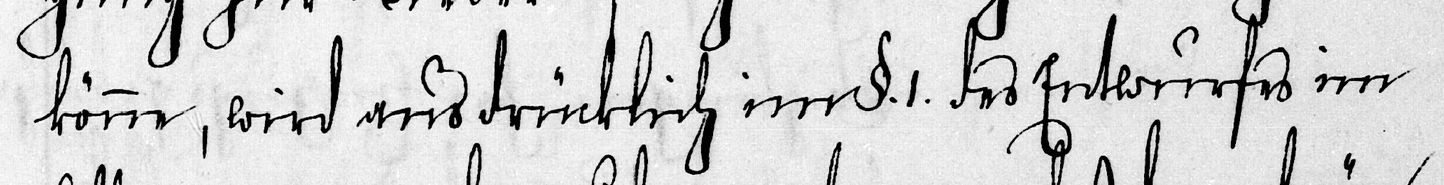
könne, wird ausdrücklich im §.1. des Entwurfes im
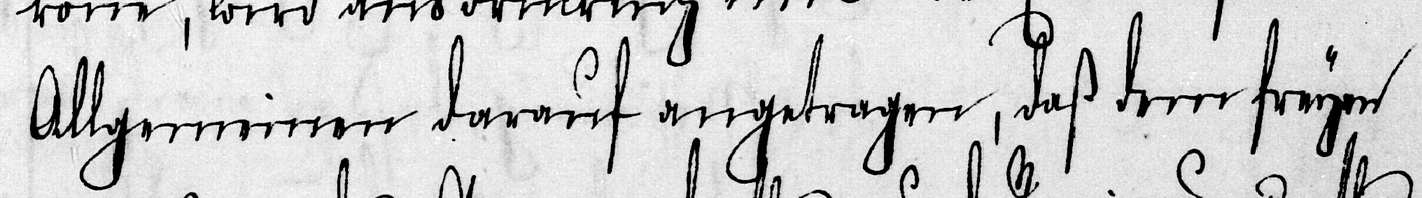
Allgemeinen darauf angetragen, daß dem freyen
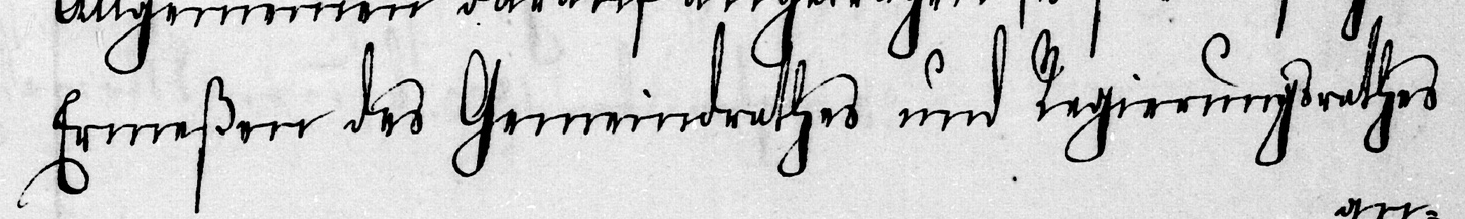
Ermeßen des Gemeindrathes und Regierungsrathes
